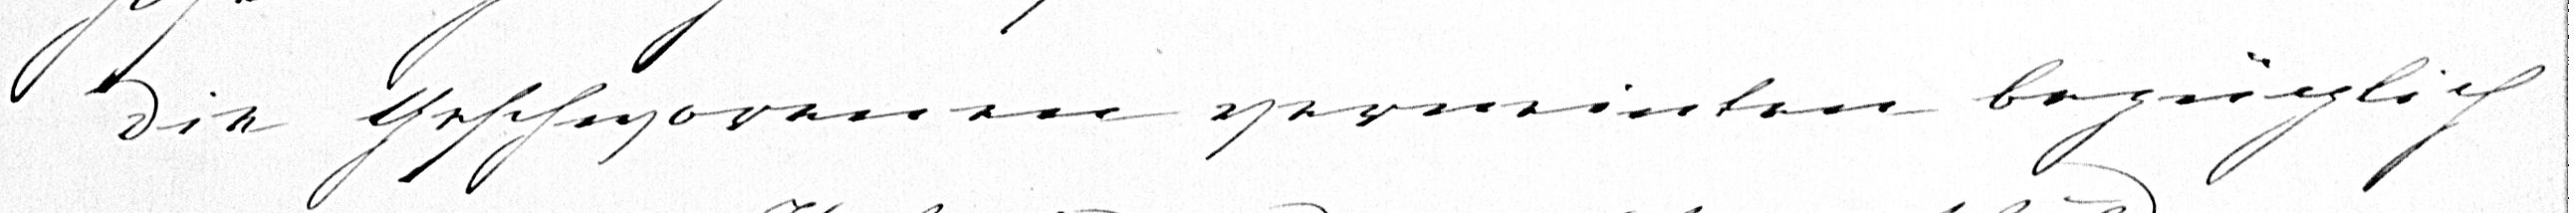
Die Geschworenen verminten bezüglich
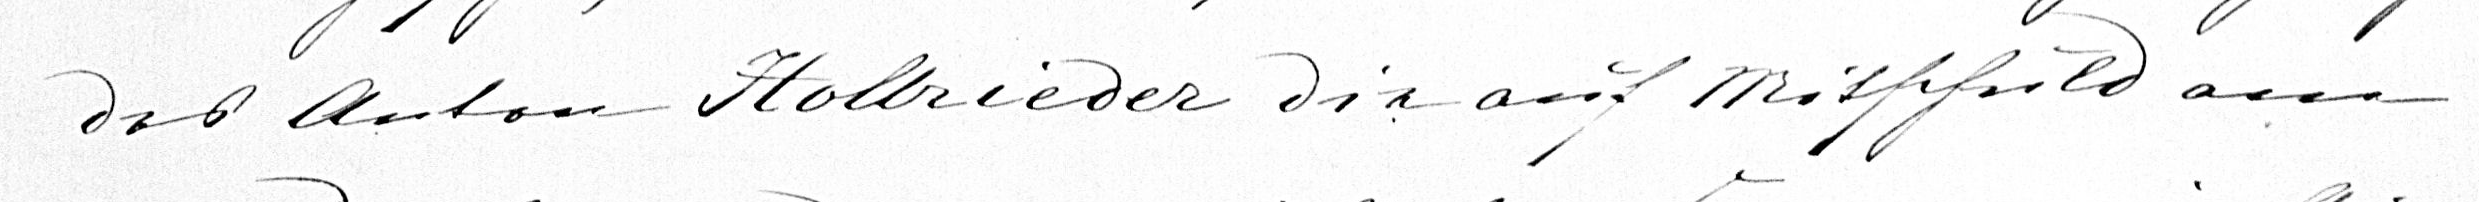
des Anton Hollrieder die auf Mitschuld am
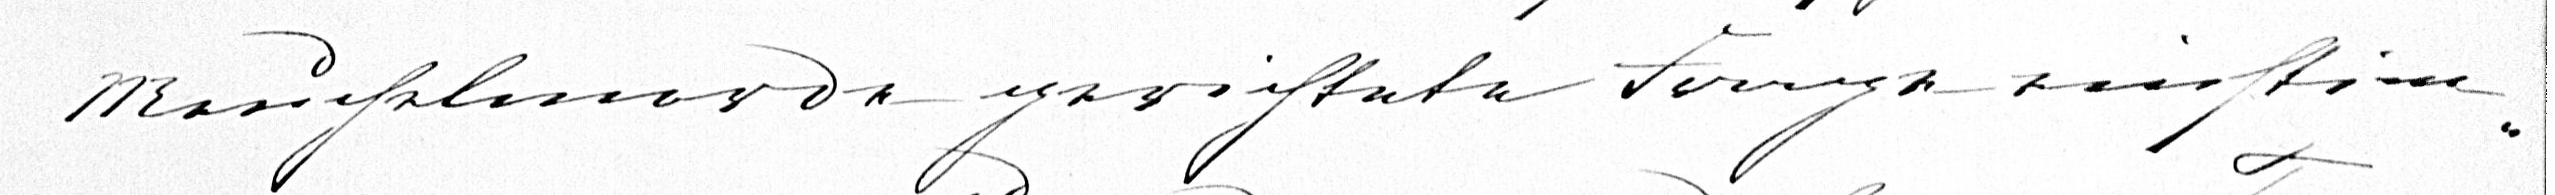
Meuchelmorde gerichtete Frage einstim¬
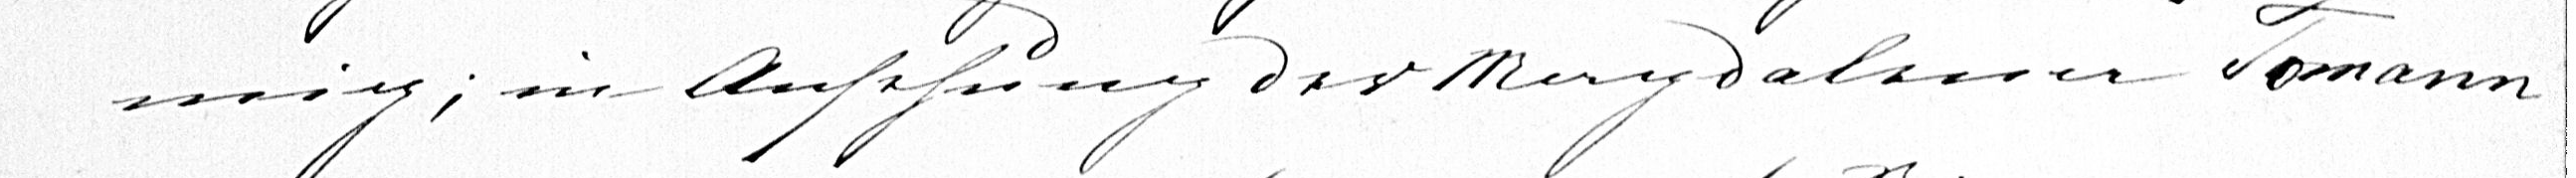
mig; in Ansehung der Magdalen Tomann
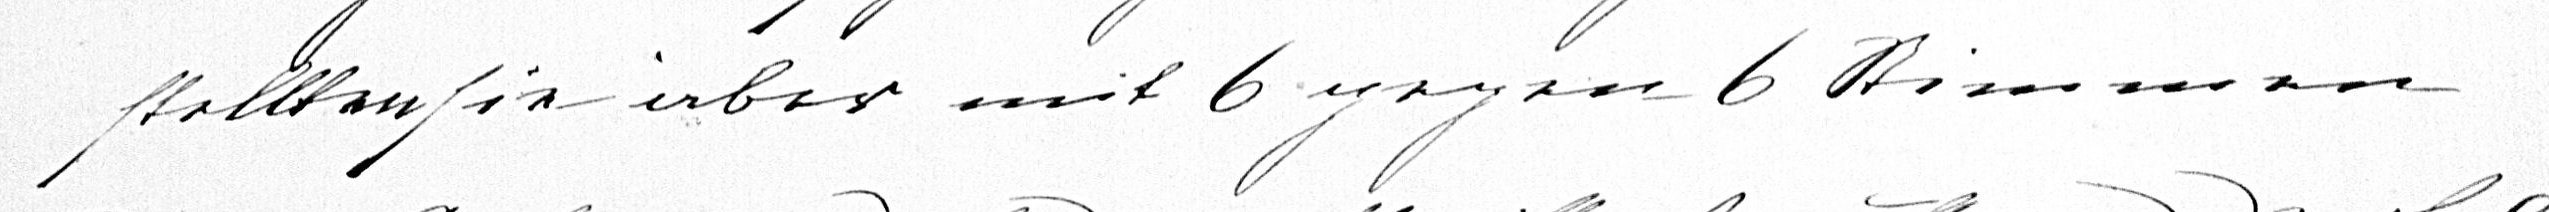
stellten sie aber mit 6 gegen 6 Stimmen
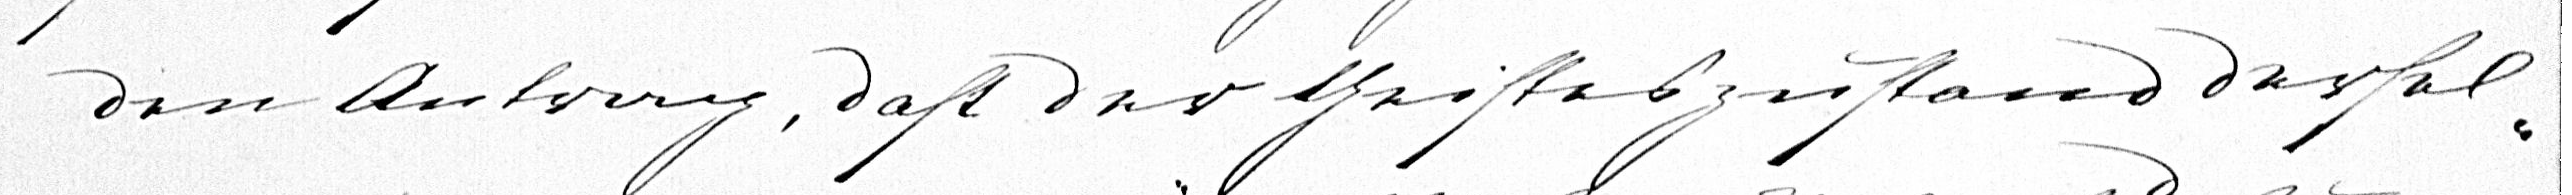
den Antrag, daß der Geisteszustand dersel¬
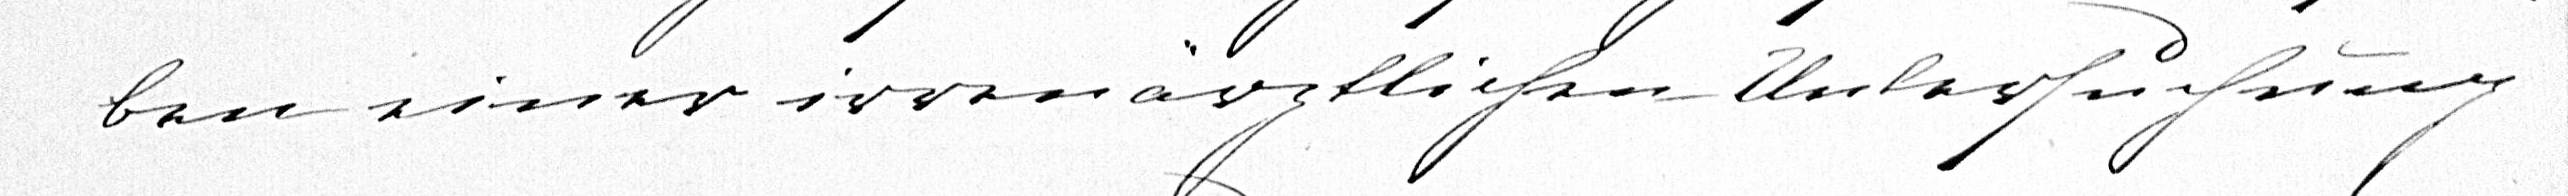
ben einer irrenärztlichen Untersuchung
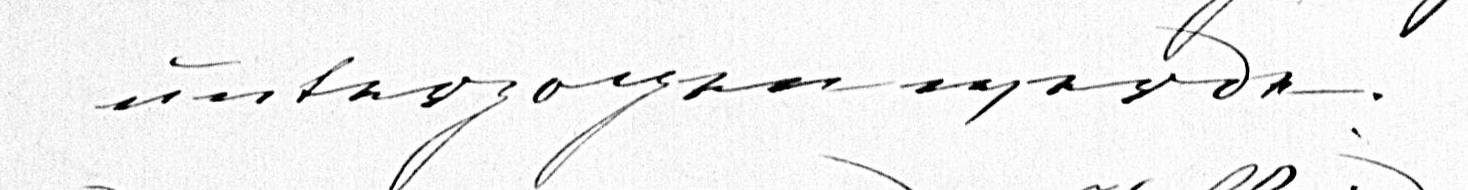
unterzogen werde.
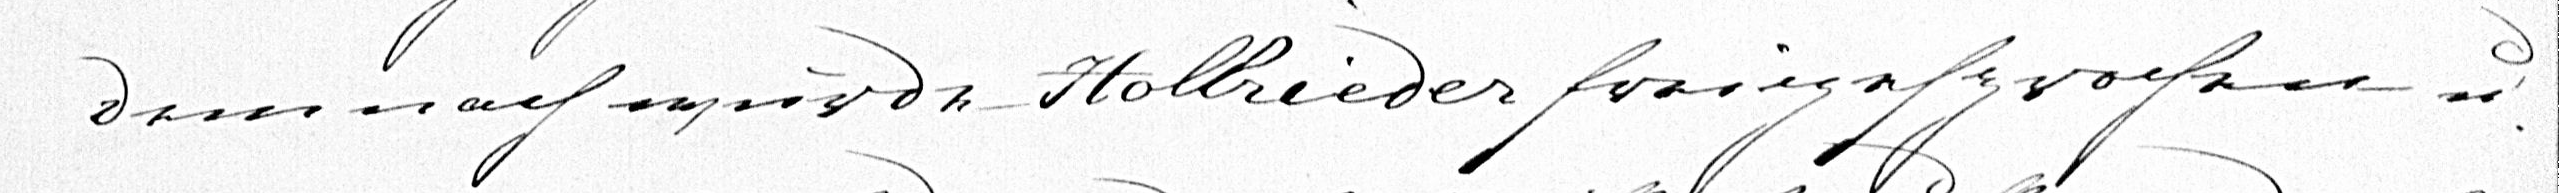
Dem nach wurde Hollrieder freigesprochen u.
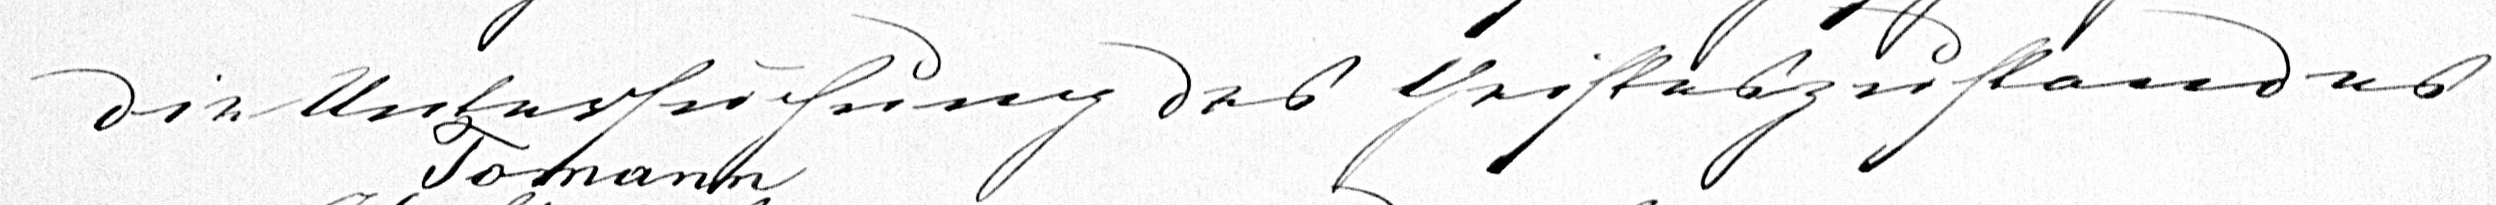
die Untersuchung des Geisteszustandes
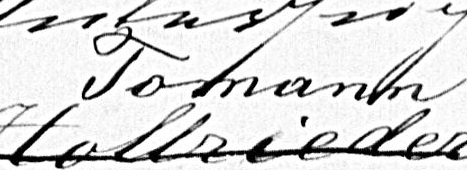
Tomann
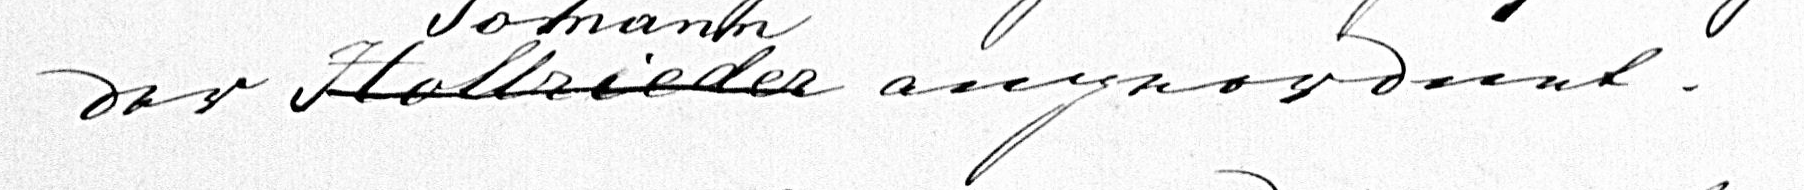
der angeordnet.
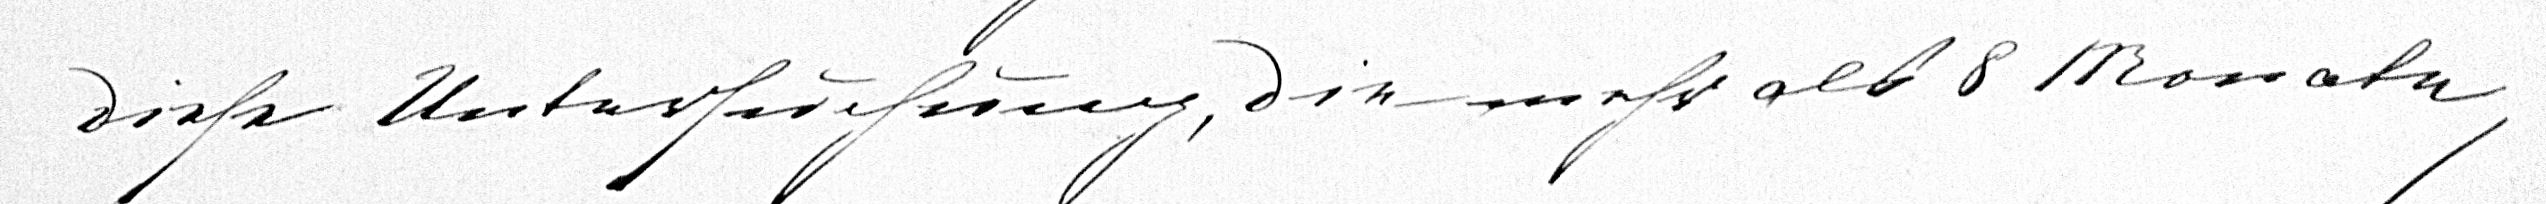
Diese Untersuchung, die mehr als 8 Monate
